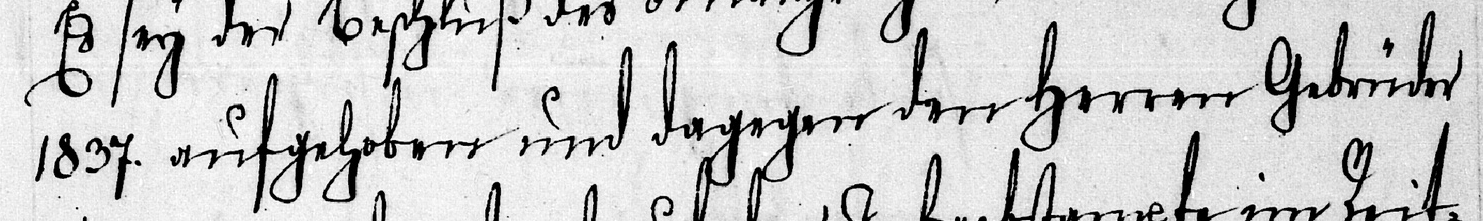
1837. aufgehoben und dagegen den Herren Gebrüder
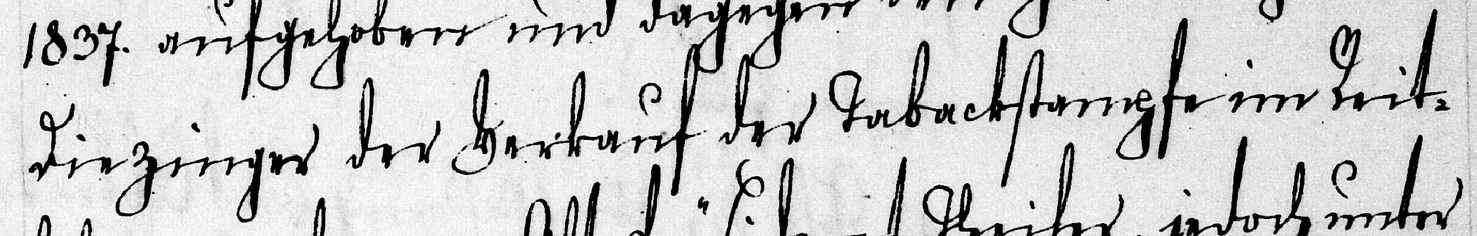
Diezinger der Verkauf der Tabackstampfe im Reit¬
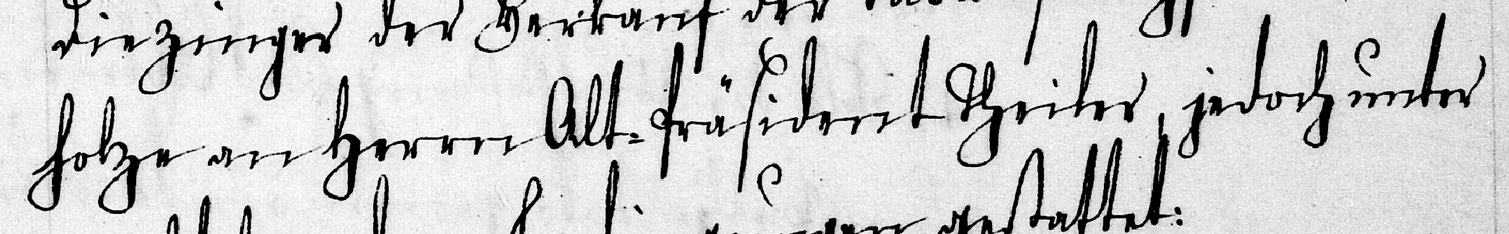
holze an Herrn Alt-Präsident Theiler, jedoch unter
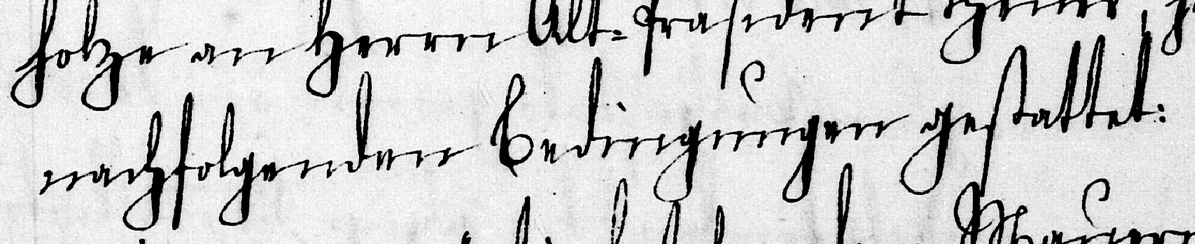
nachfolgenden Bedingungen gestattet:
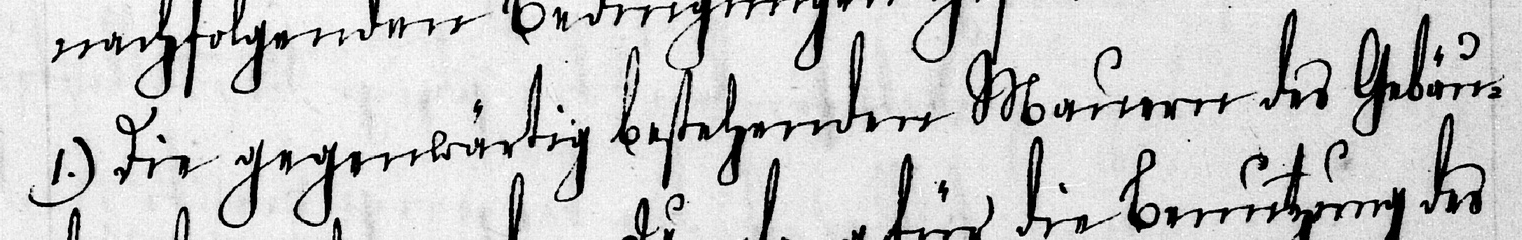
1.) Die gegenwärtige bestehenden Mauern des Gebäu¬
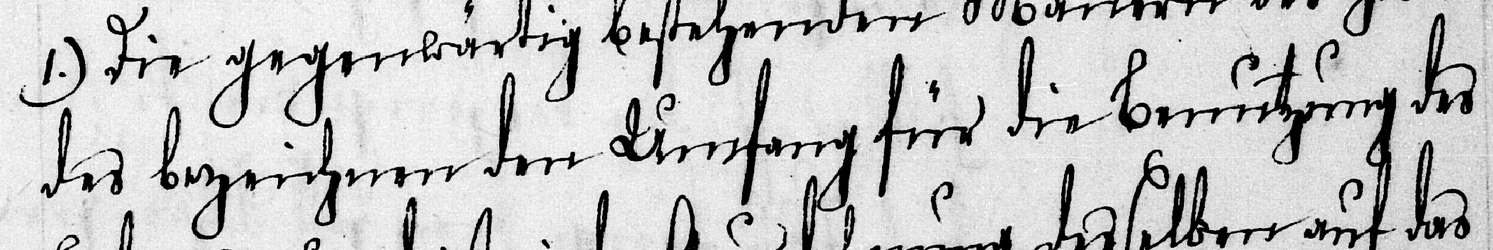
des bezeichnen den Umfang für die Benutzung des
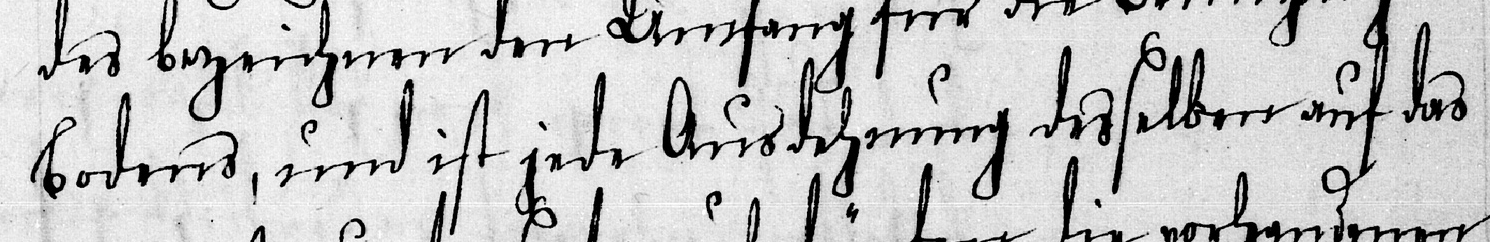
Bodens, und ist jede Ausdehnung desselben auf das
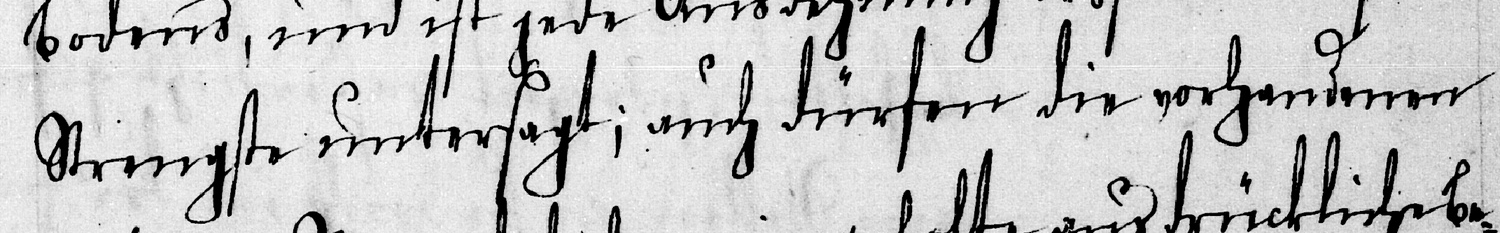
Strengste untersagt; auch dürfen die vorhandenen
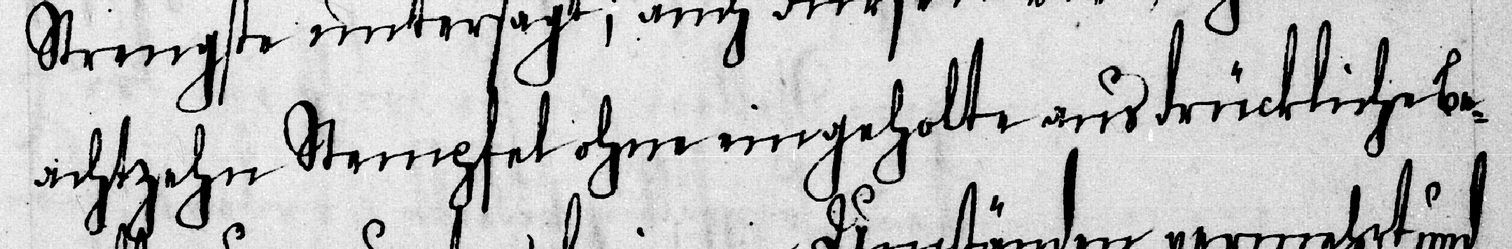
achtzehn Stempfel ohne eingeholte ausdrückliche Be¬
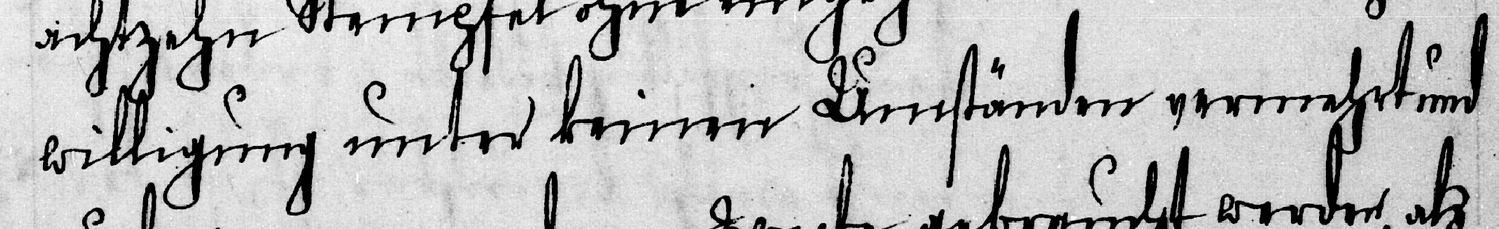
willigung unter keinen Umständen vermehrt und
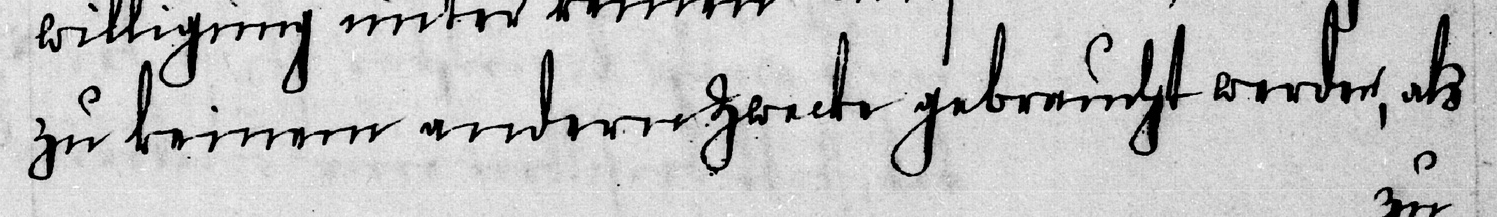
zu keinem andern Zwecke gebraucht werden, als
